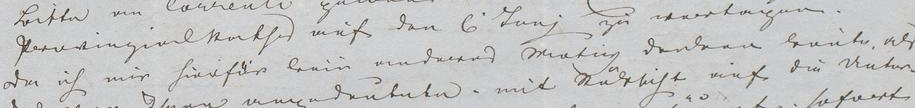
Da ich mir hierfür kein anderes Motiv denken konnte, als
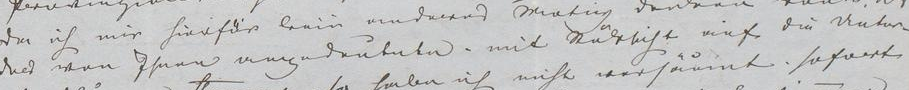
das von Ihnen angedeutete – mit Rüksicht auf die Unter-
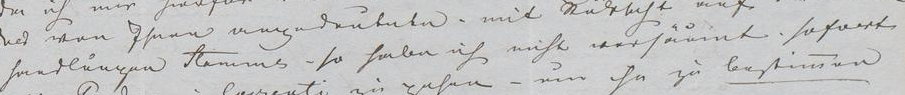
handlungen Stamms – so habe ich nicht versäumt – sofort
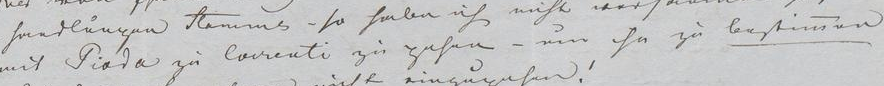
mit Pioda zu Correnti zu gehen – um ihn zu bestimmen
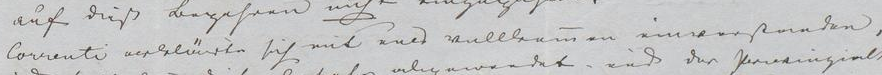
Correnti erklärte sich mit uns vollkommen einverstanden,
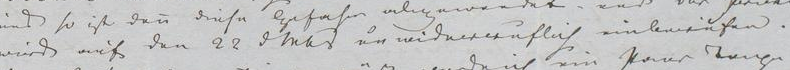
wird auf den 22 dMts unwiderruflich einberufen.
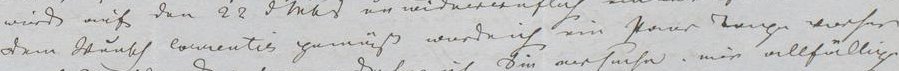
Dem Wunsch Correntis gemäß werde ich ein Paar Tage vorher
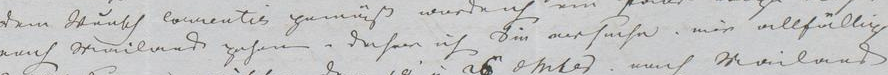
nach Mailand gehen – daher ich Sie ersuche – mir allfällige
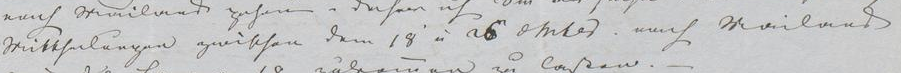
Mittheilungen zwischen dem 16t u 26t dMts – nach Mailand
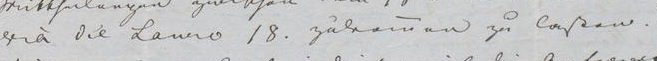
via del Lauro 18. zukommen zu laßen. –
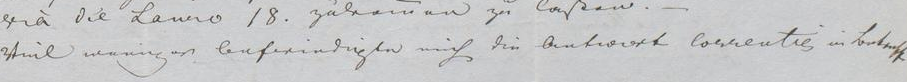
Viel weniger befriedigte mich die Antwort Correntis in Betreff
